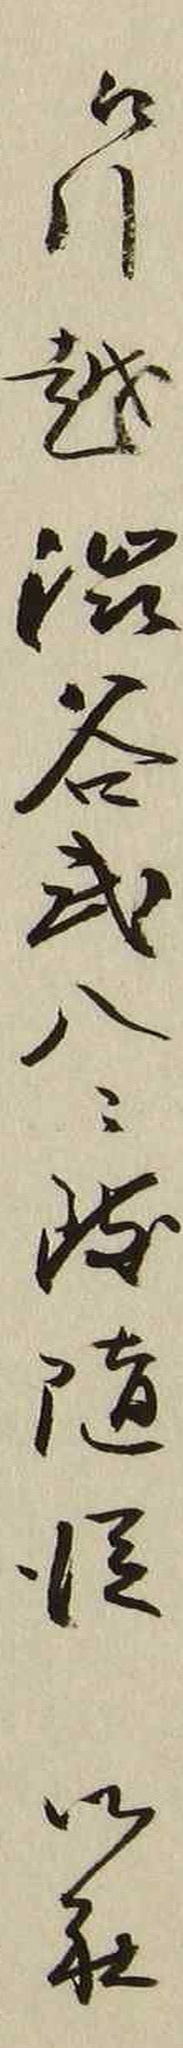江引越渋谷武八ニ致随従御社
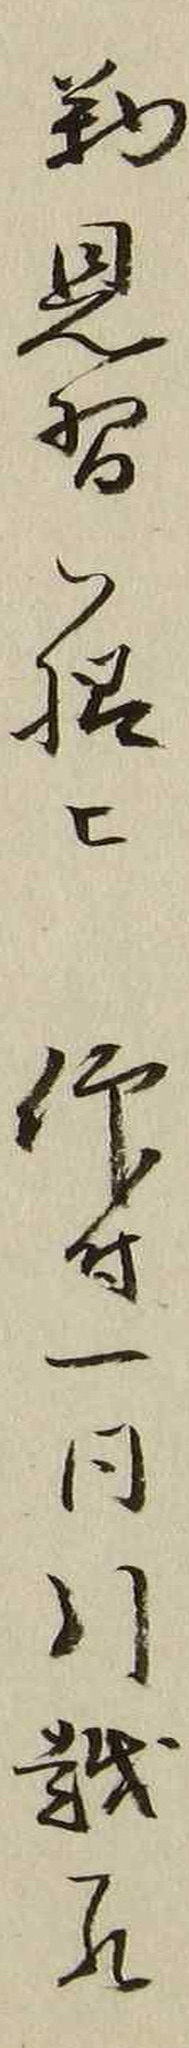勤見習候様被仰付一同引越罷
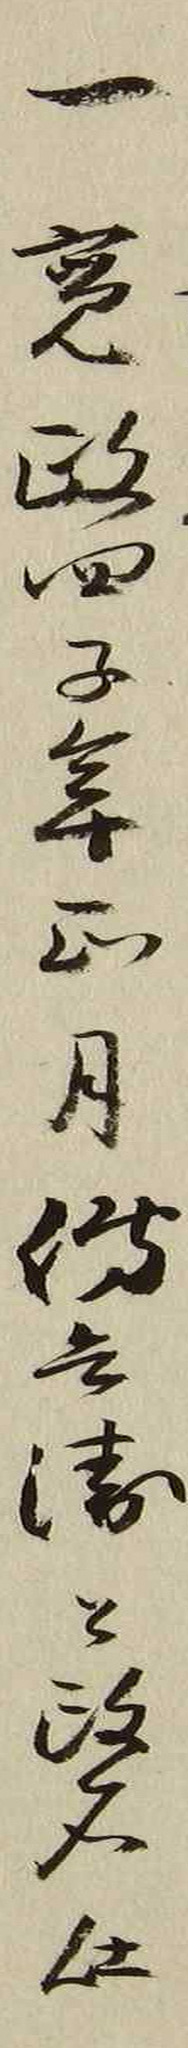一寛政四子年正月伝兵衛と改名仕
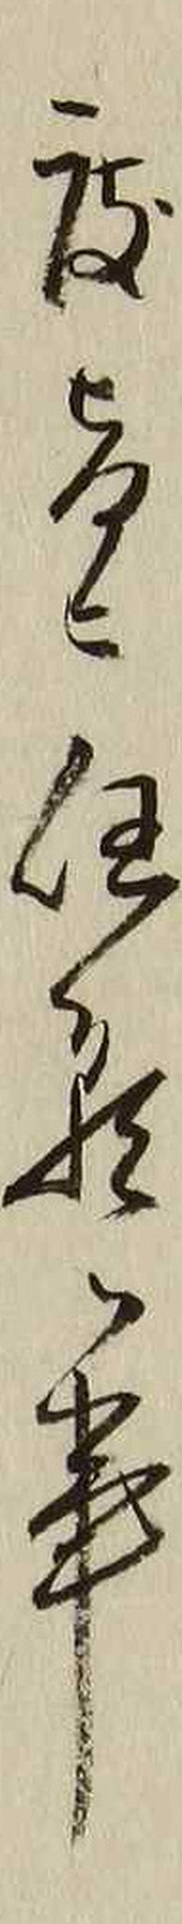度旨被任願候事
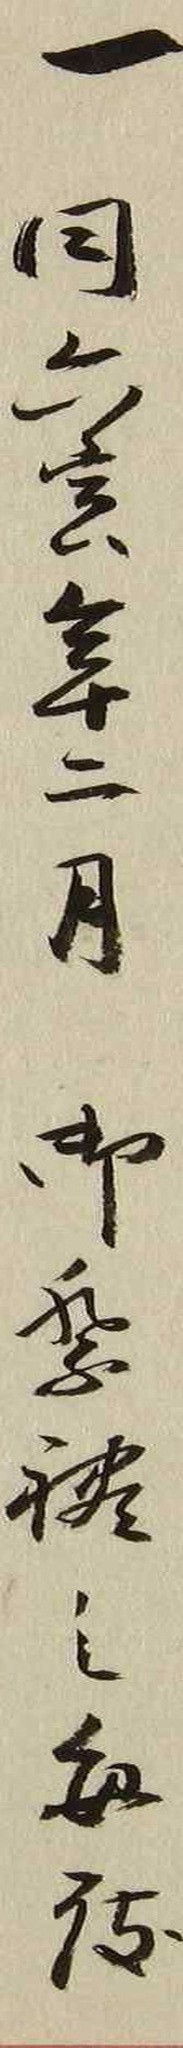一同六寅年二月御祭礼之毎度
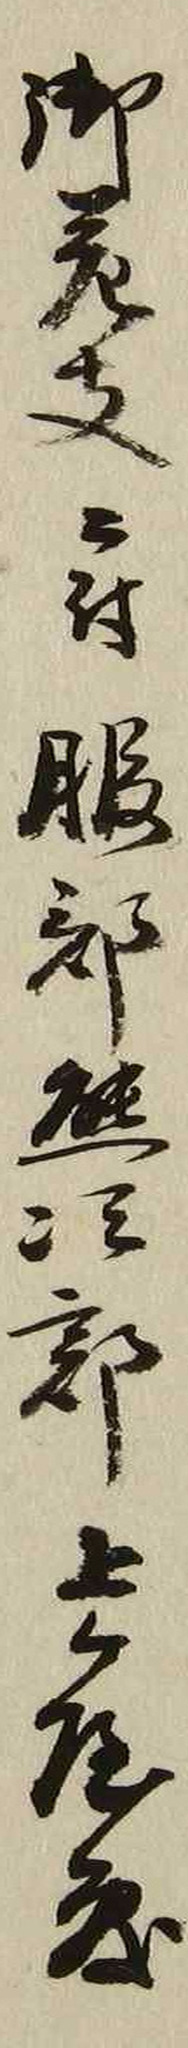御差支ニ付服部熊次郎上ヶ屋敷
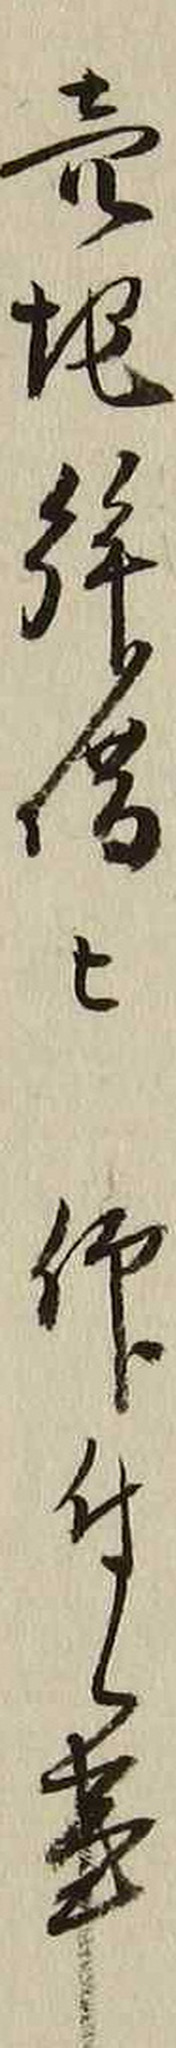売地拝借被仰付候事
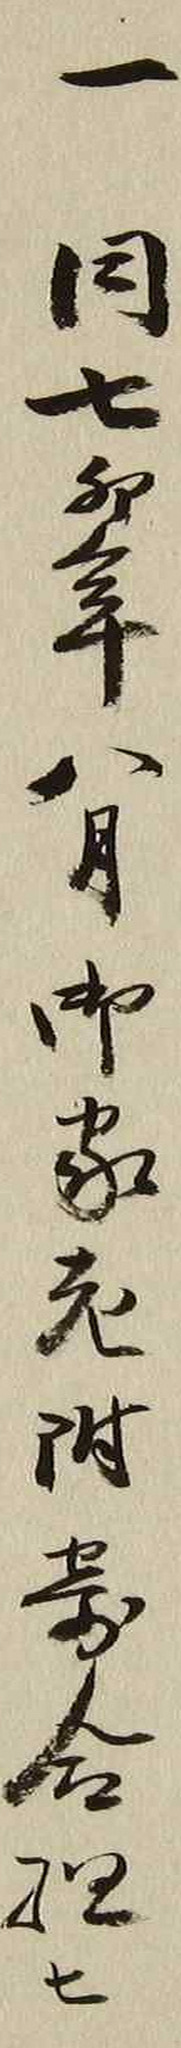一同七卯年八月御家老附寄合組被
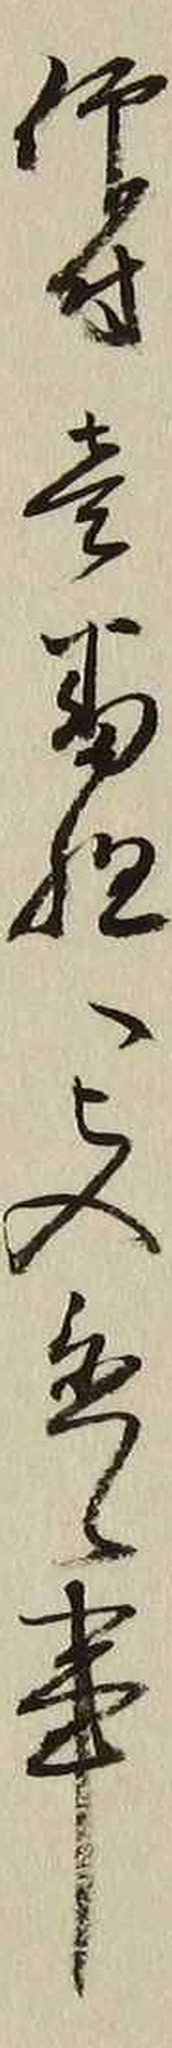仰付壱番組へ被入置候事
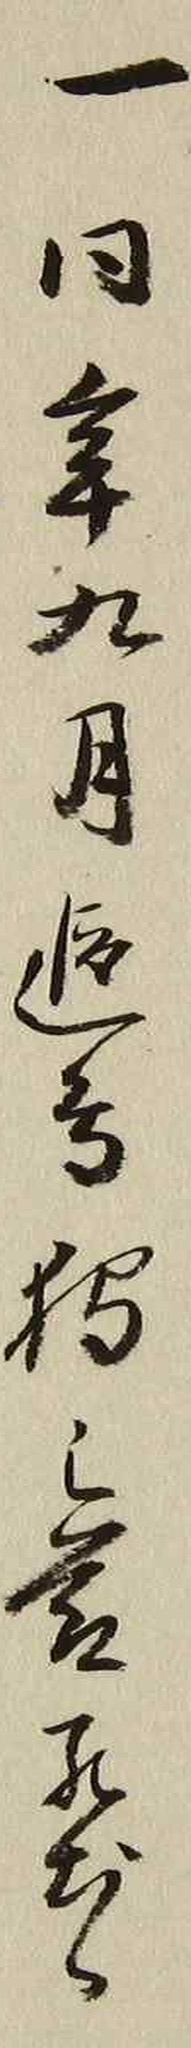一同年九月追鳥狩之節罷出候
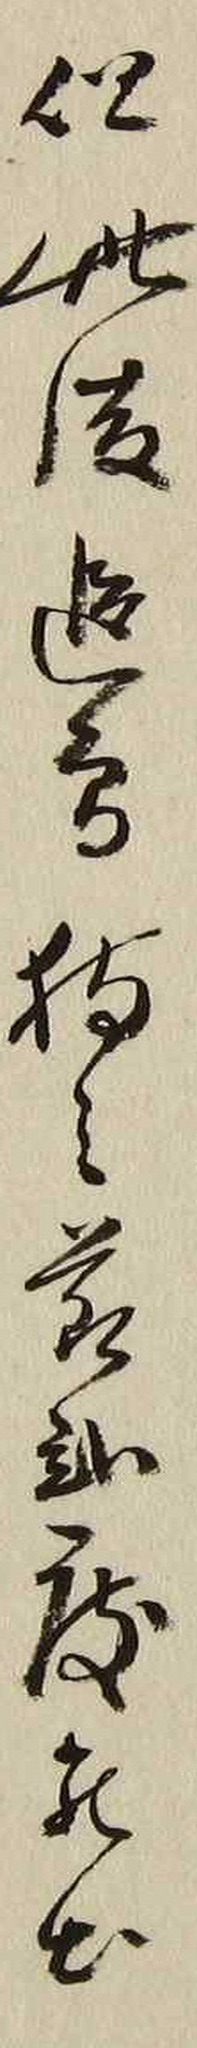但此後追鳥狩之節弐度罷出
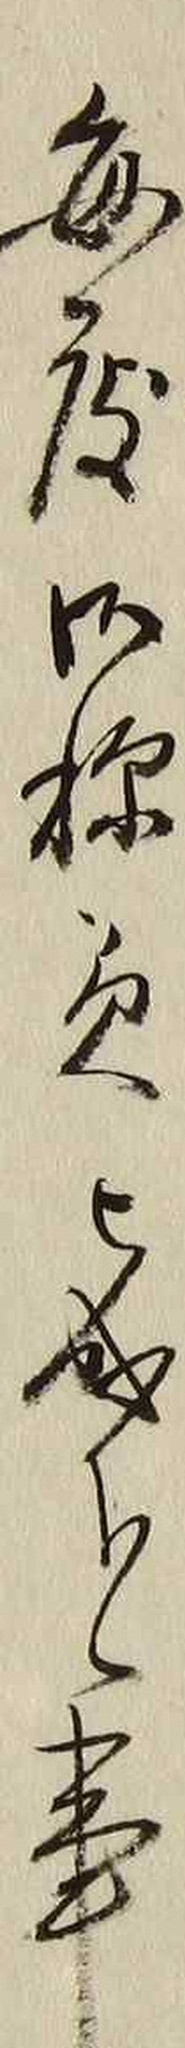毎度御称美被成下候事
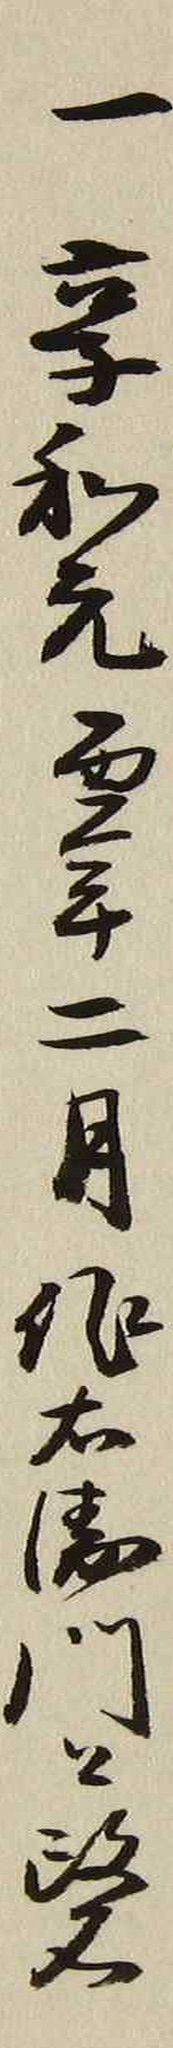一享和元酉年二月作右衛門と改名
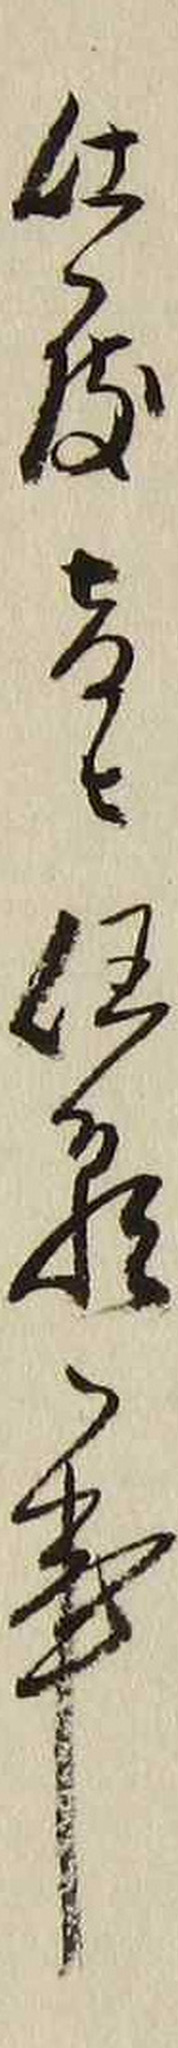仕度旨被任願候事
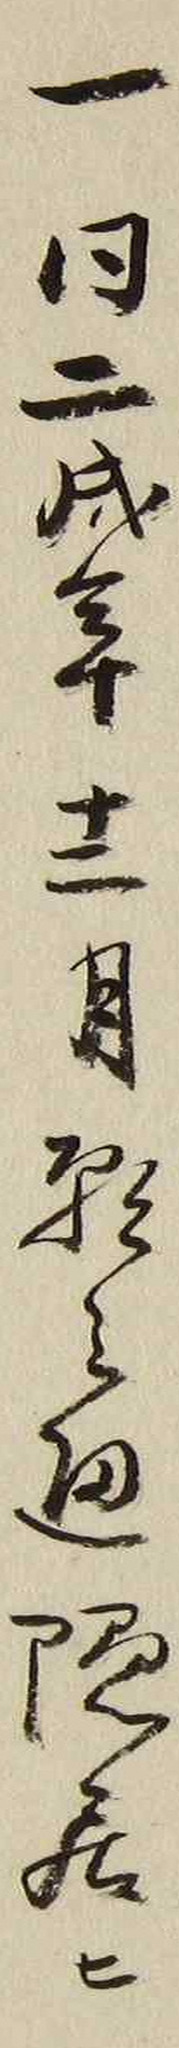一同二戌年十二月願之通隠居被
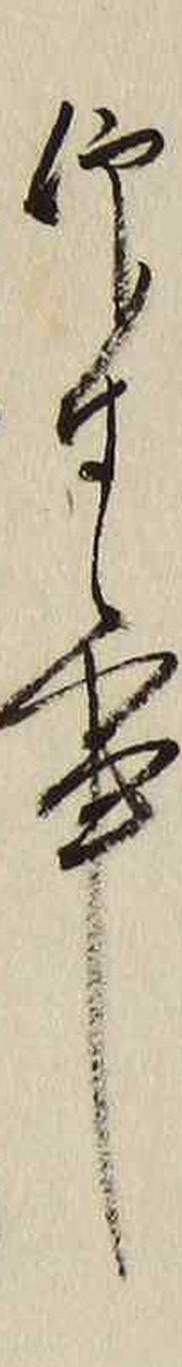仰付候事
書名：諸士系譜　巻之291　さ之部23
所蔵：会津若松市立会津図書館
